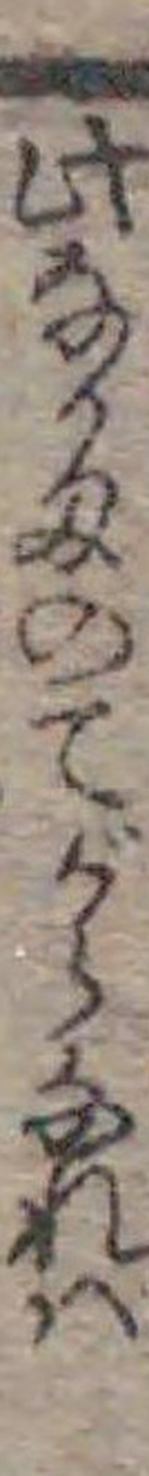此なかまのてがらなれば
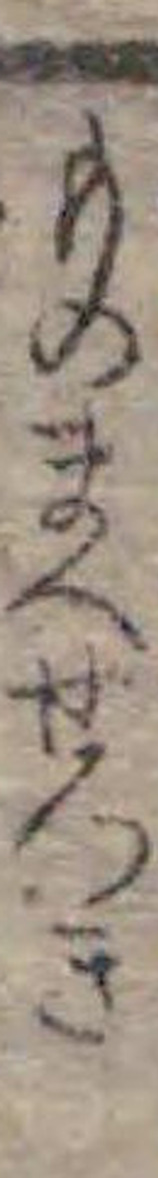ものまへせつき
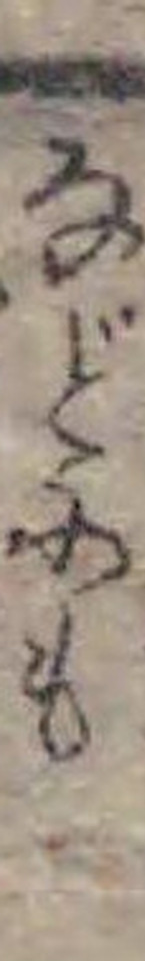などにも
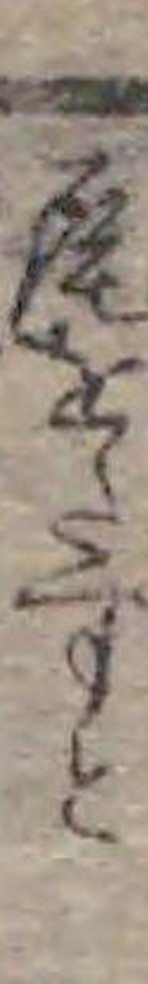尾をたすと
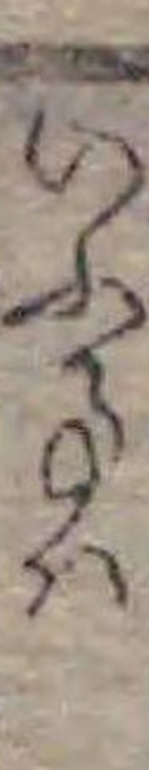いふ事は
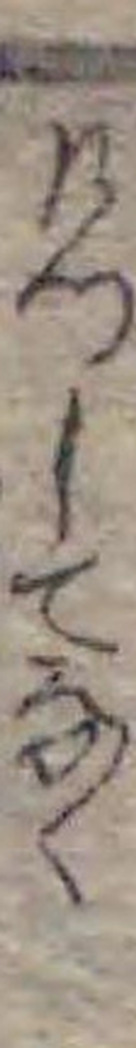けつしてなく
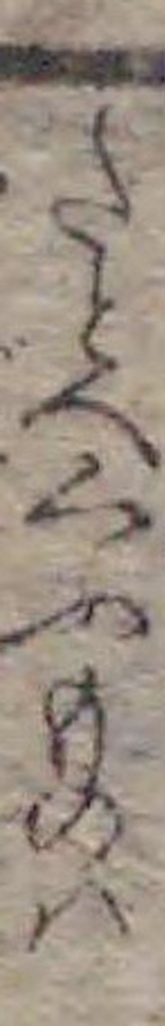たとへくふものは
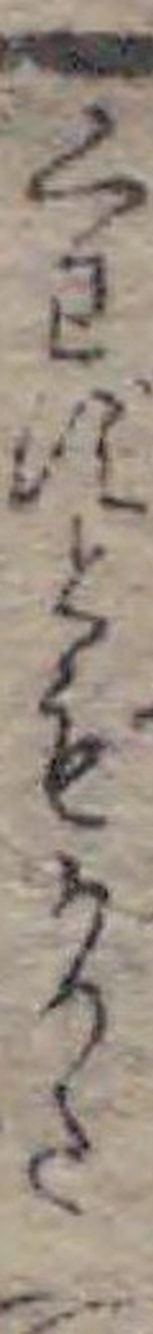くわずともかりた
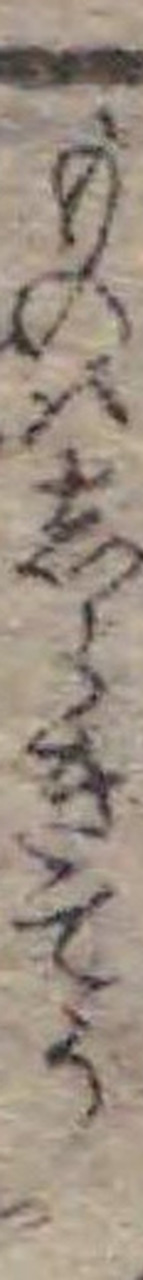ものはしらきてう
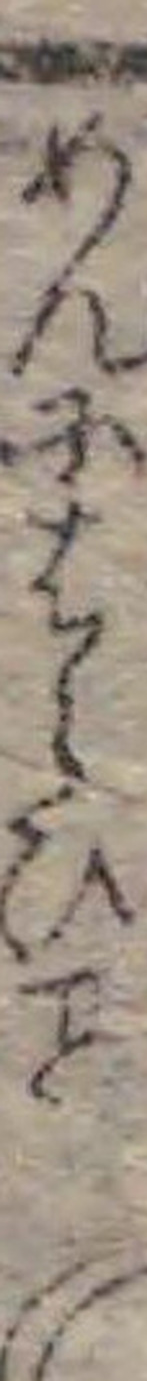めんにはらひこと
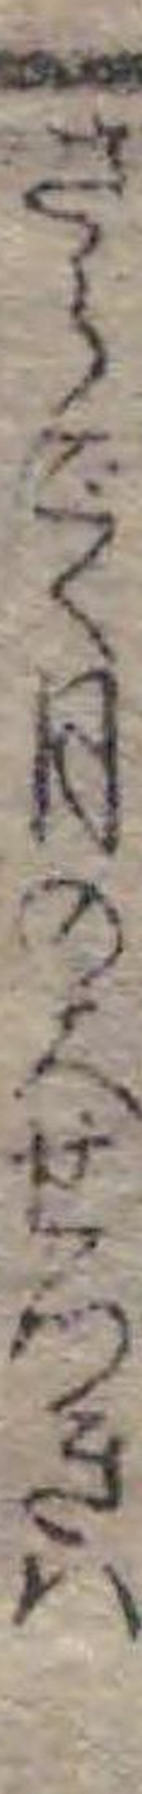さらごく月の大せつきは
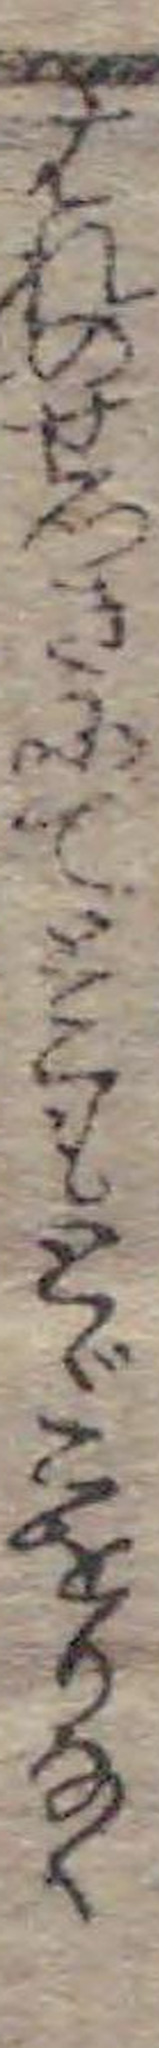はれのせつきにてとこもとゞこをりなく
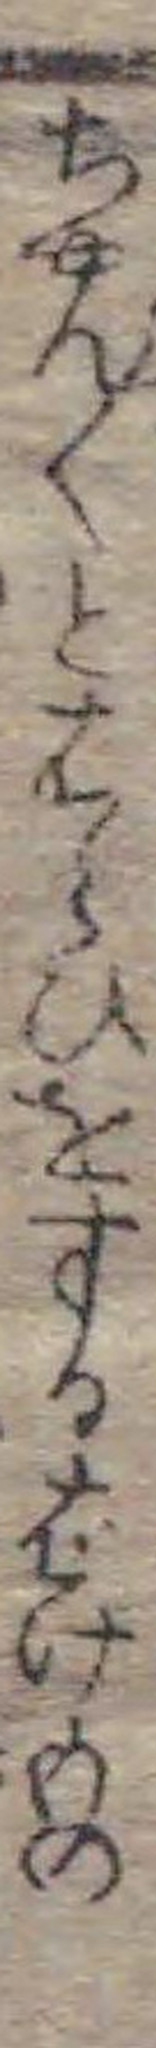ちやん〳〵とはらひをするばけもの
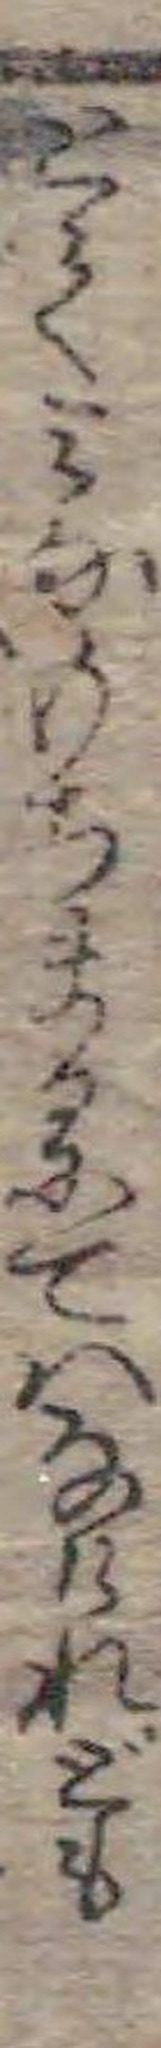とてみなもちまるにてはなけれども
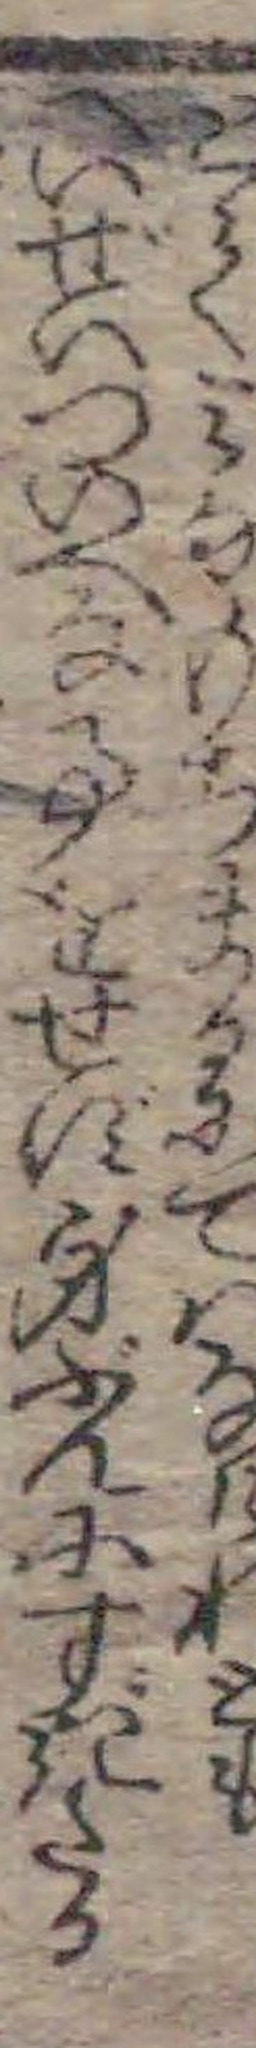へいぜいついへな事をせず身ぶんにすぎたる
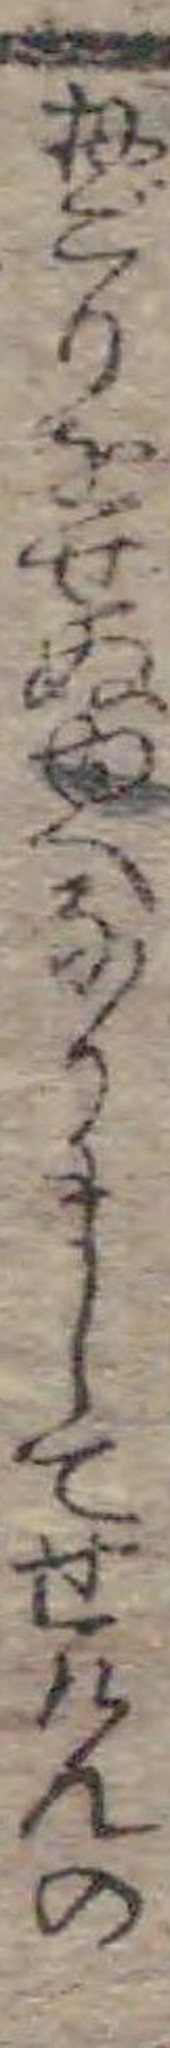おごりをせぬゆへなりましてせけんの
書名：年中行状記 : 2巻
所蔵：国立国会図書館 National Diet Library, JAPAN
